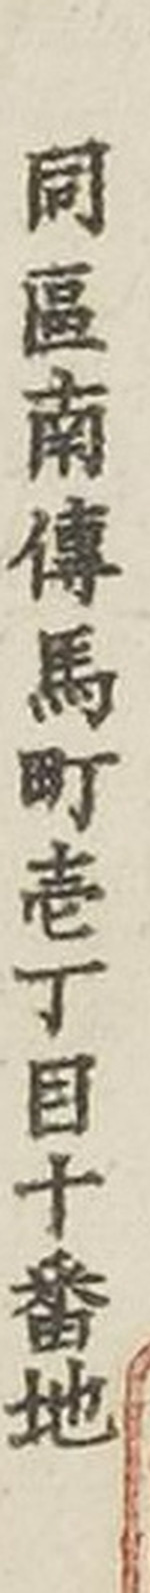同区南伝馬町壱丁目十番地
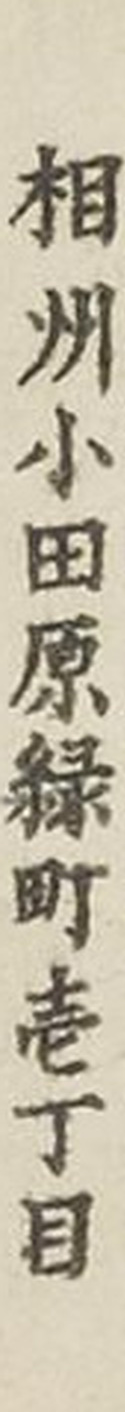相州小田原緑町壱丁目
